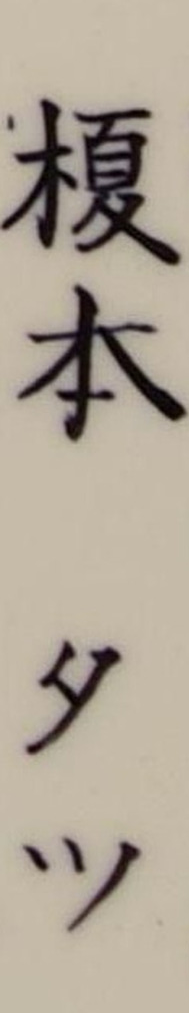榎本タツ
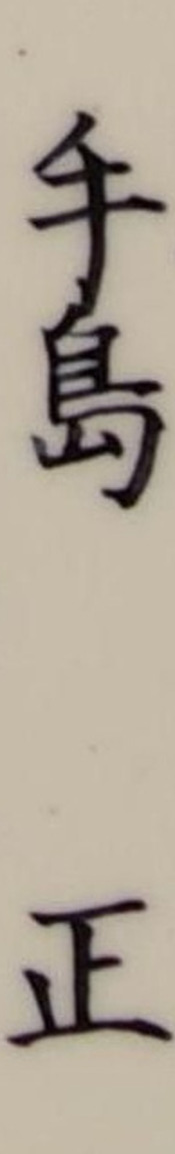手島正
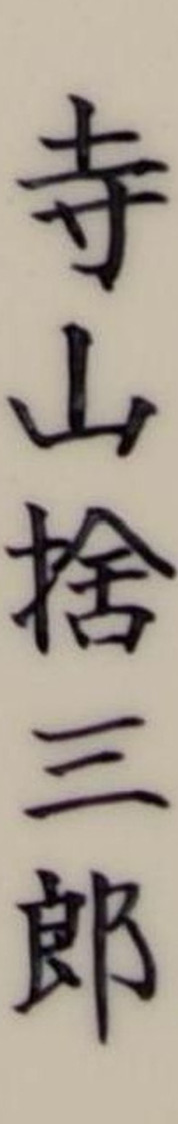寺山捨三郎
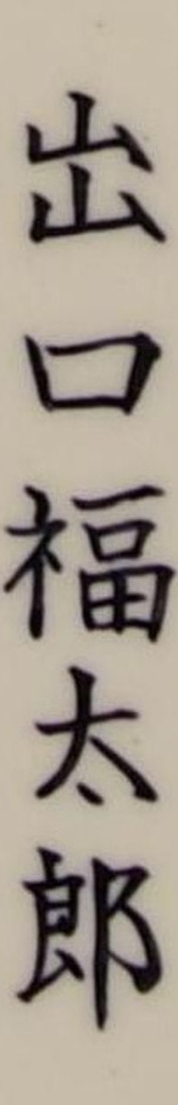出口福太郎
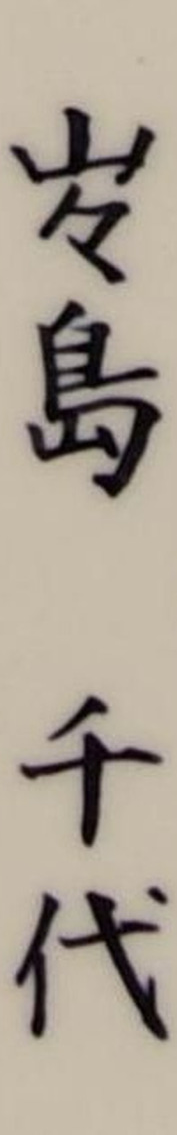出島千代
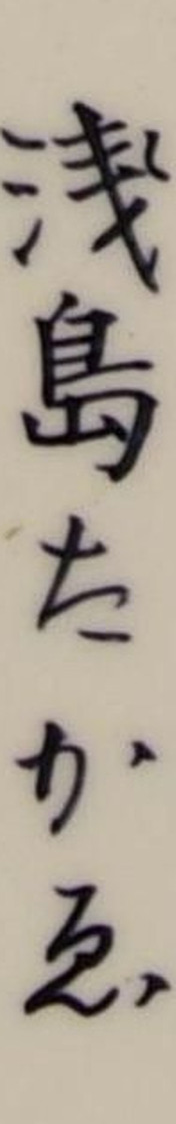浅島たかえ
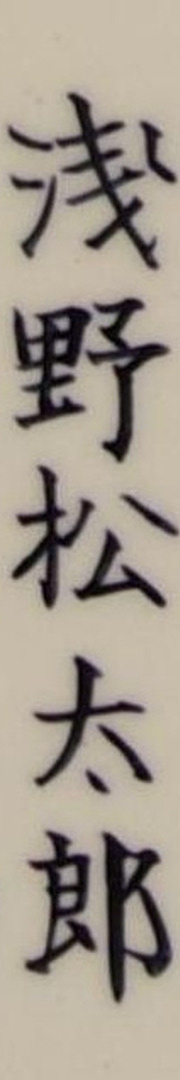浅野松太郎
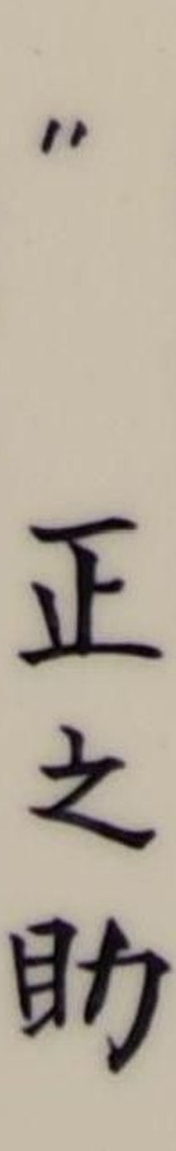正之助
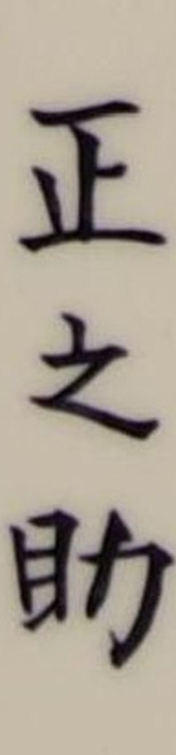正之助
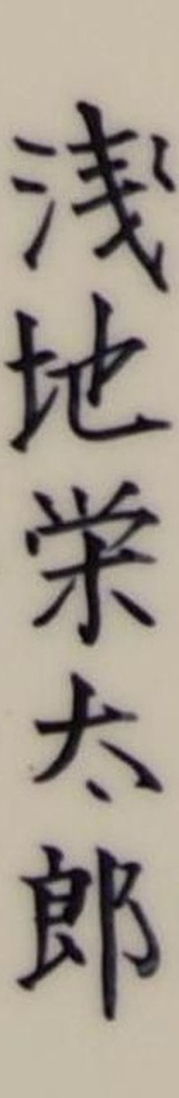浅地栄太郎
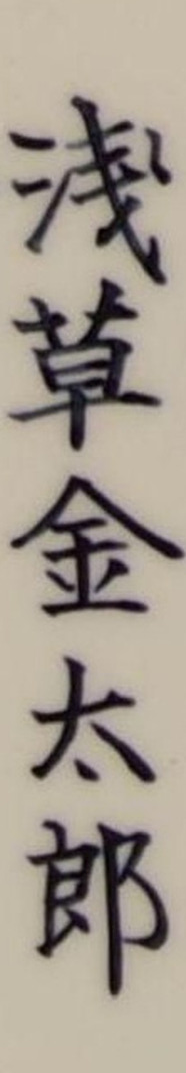浅草金太郎
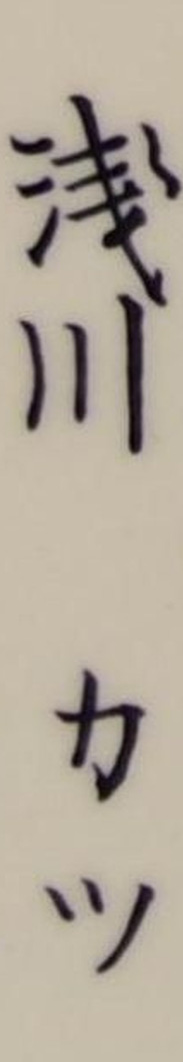浅川カツ
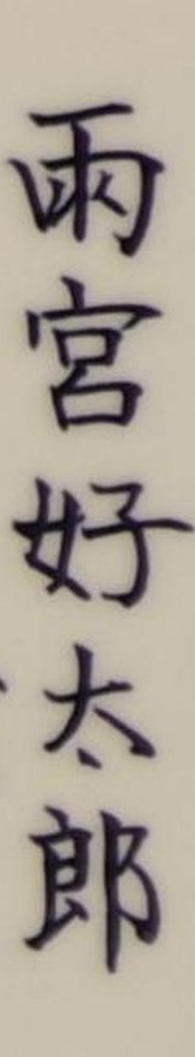雨宮好太郎
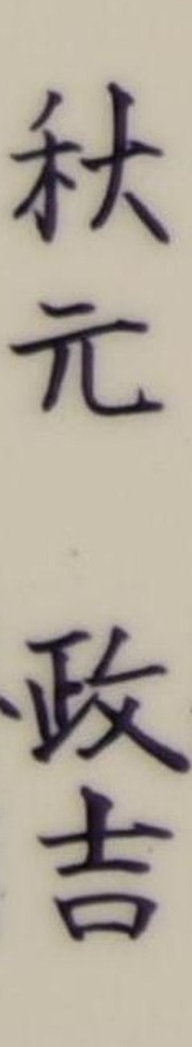秋元政吉

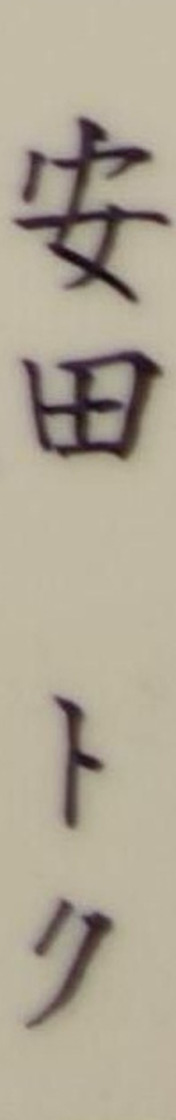安田トク
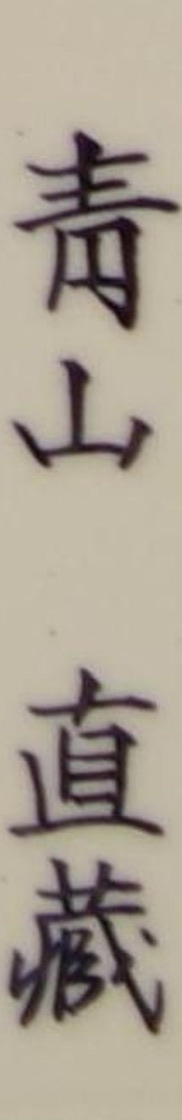青山直蔵
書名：E~L
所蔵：高野山金剛峯寺
